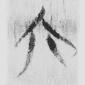六
